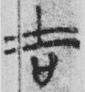吉
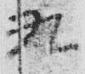九
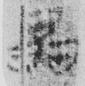晶（三）
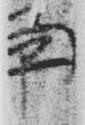○（需）
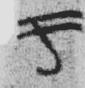于
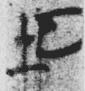○（坭）
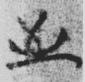至（致）
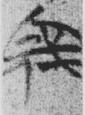○（寇）
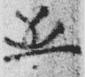至
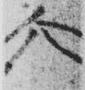六
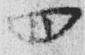四
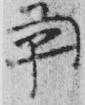○（需）
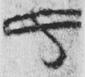于
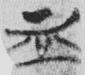血
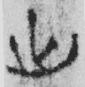出
